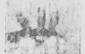卅
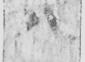八
